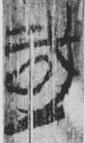或（又）
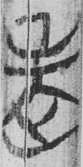老
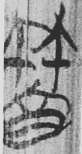○（孰）
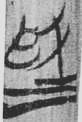爲
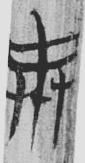奉
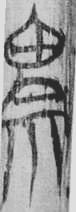○（鬼）
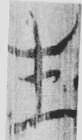生
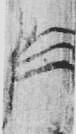於
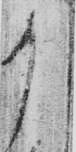人
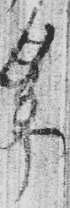○（奚）
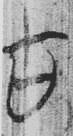古（故）
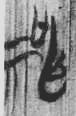神
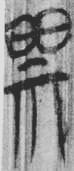○（明）
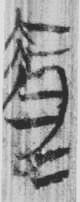骨
